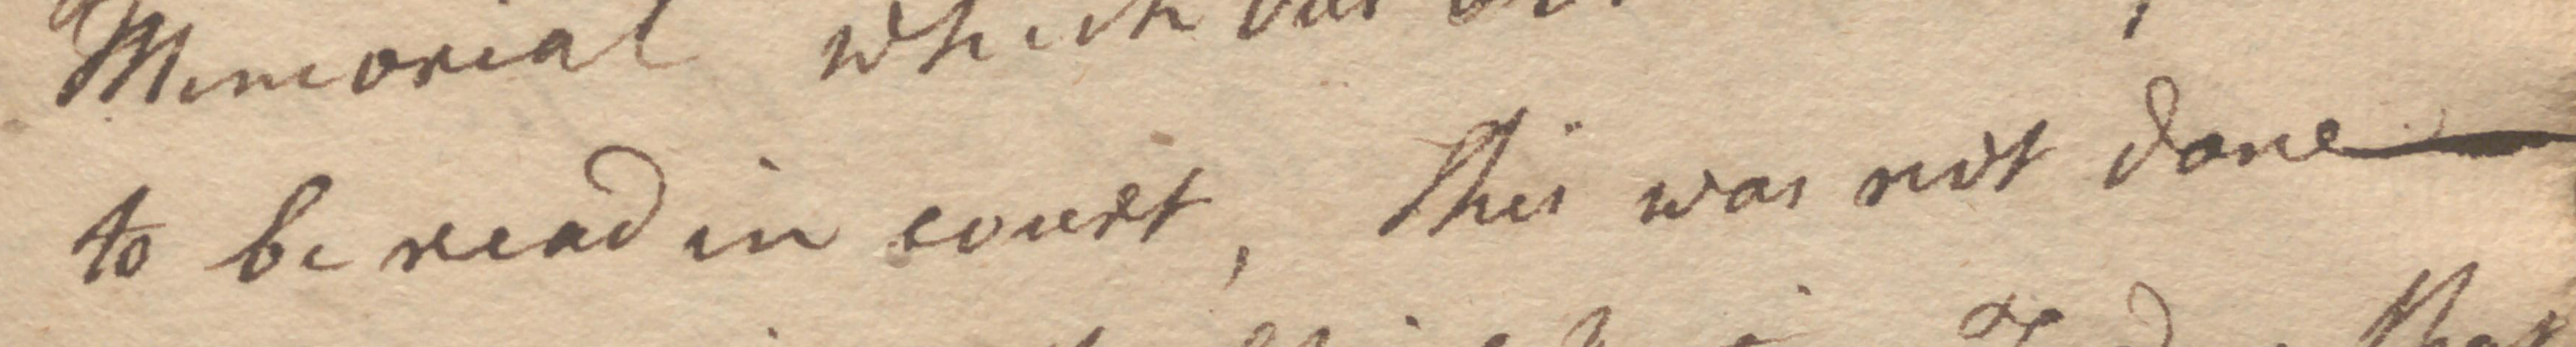to be read in court, this was not done
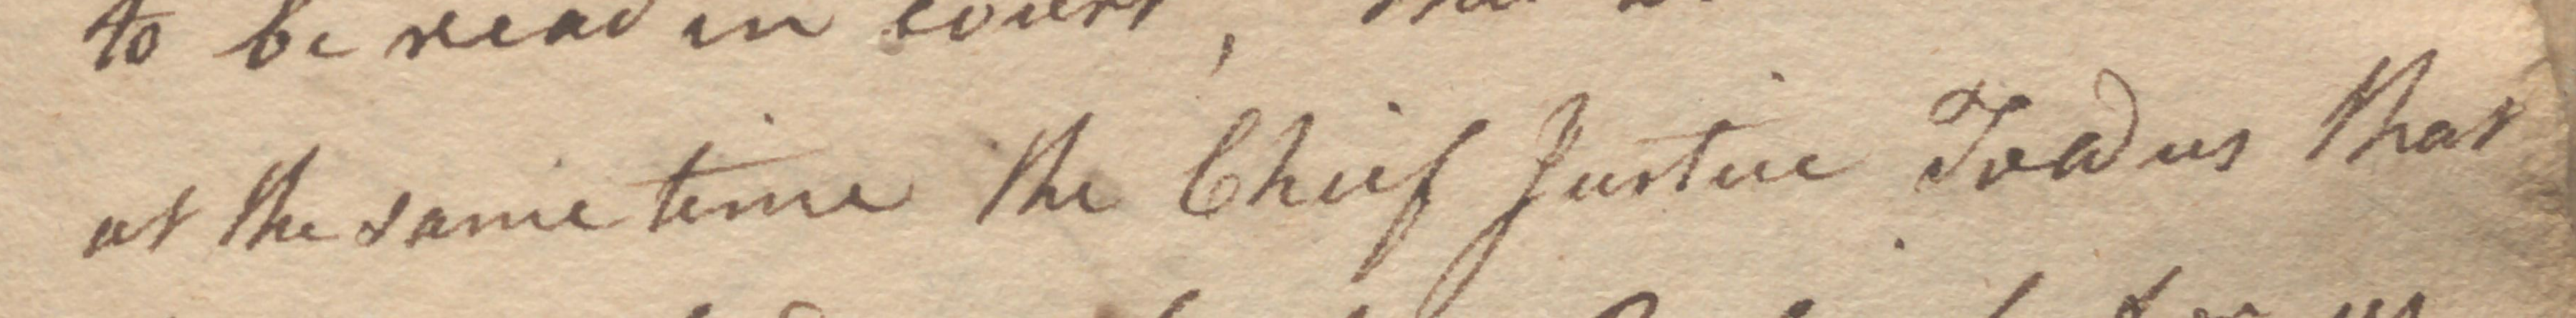at the same time the Chief Justice Tod us that
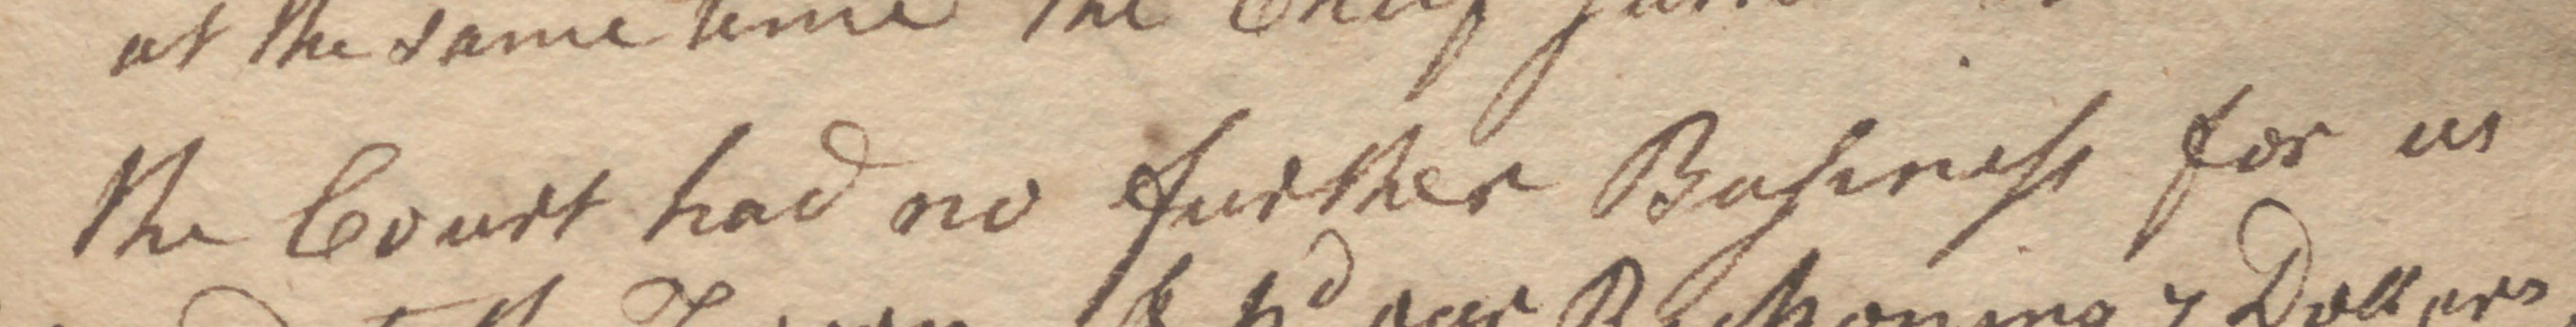the Court had no further Business for us
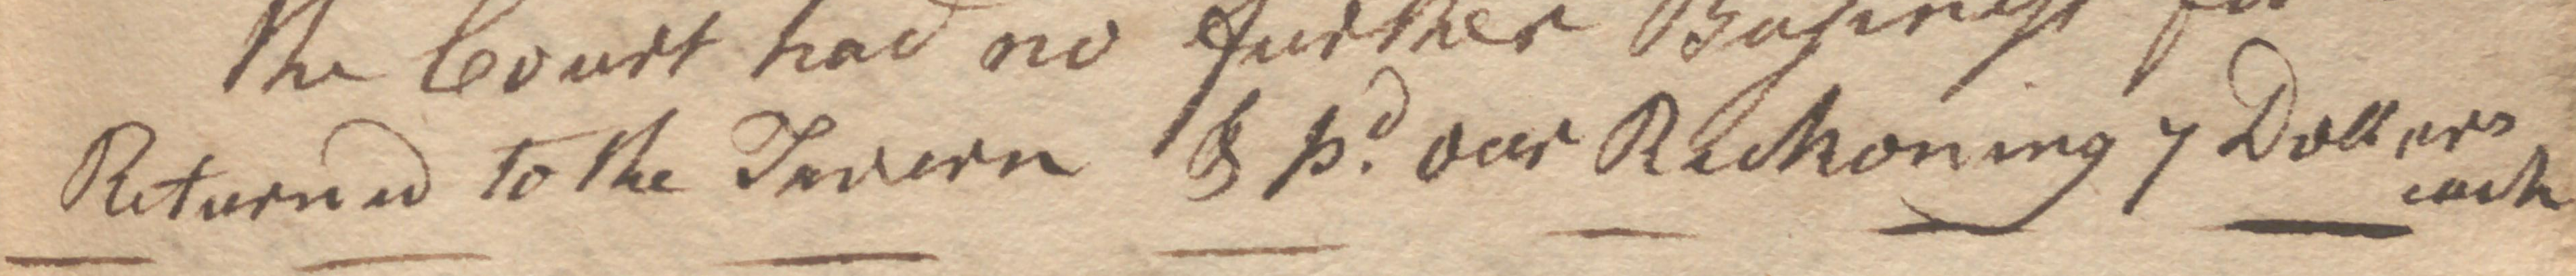Returned to the Tavern & p^d. our Rickoning 7 Dollars
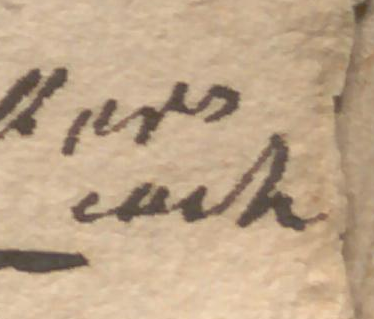each
